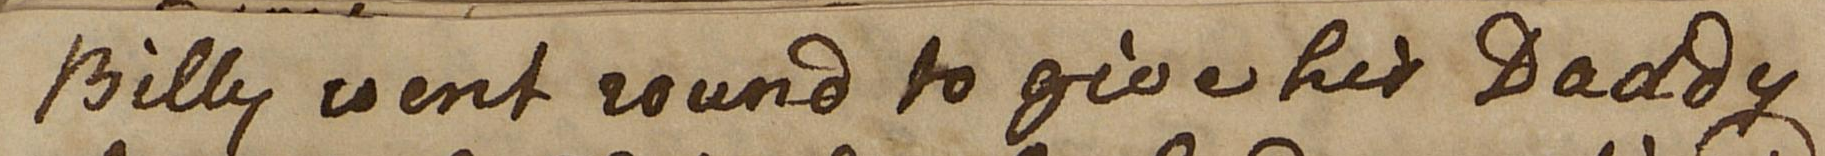Billy went round to give his Daddy
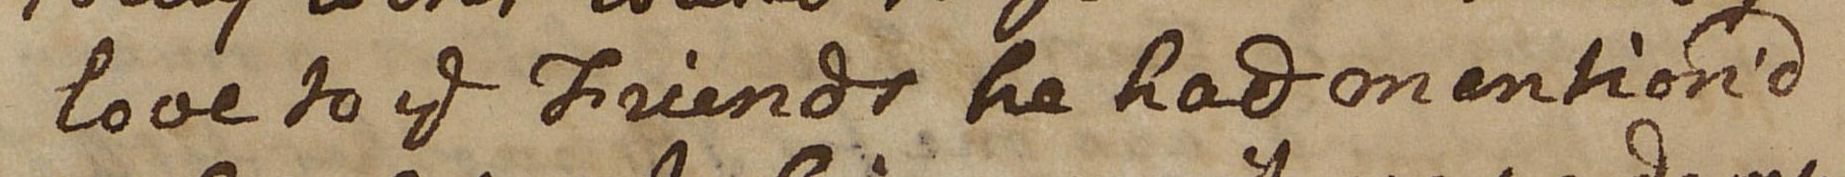love to y^e Friends he had mention'd
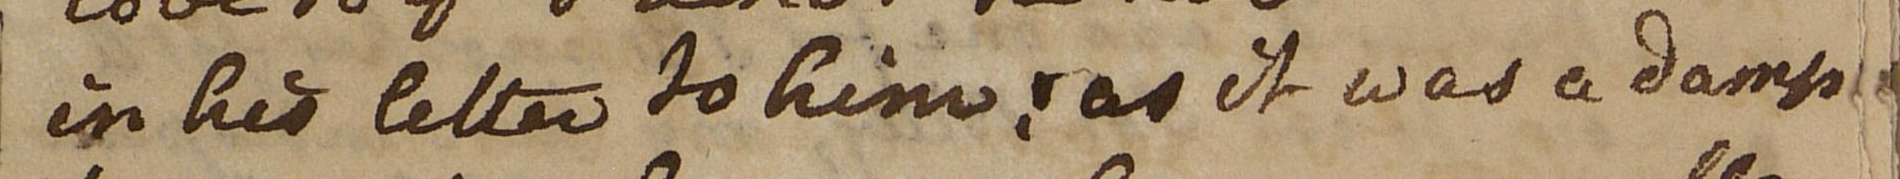in his letter to him; as it was a damp
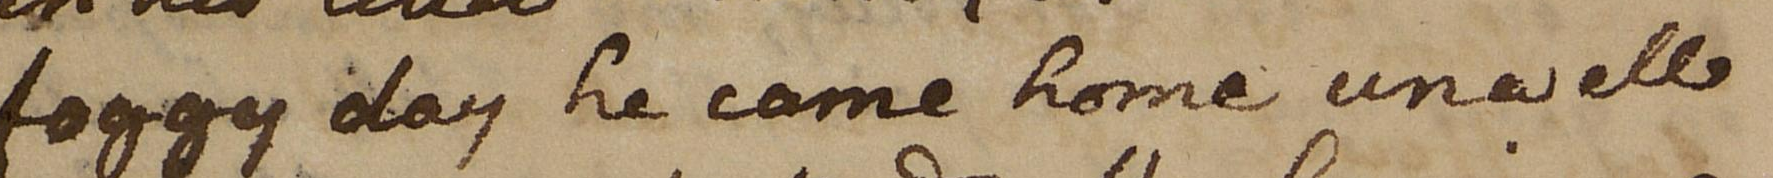foggy day he came home unwell
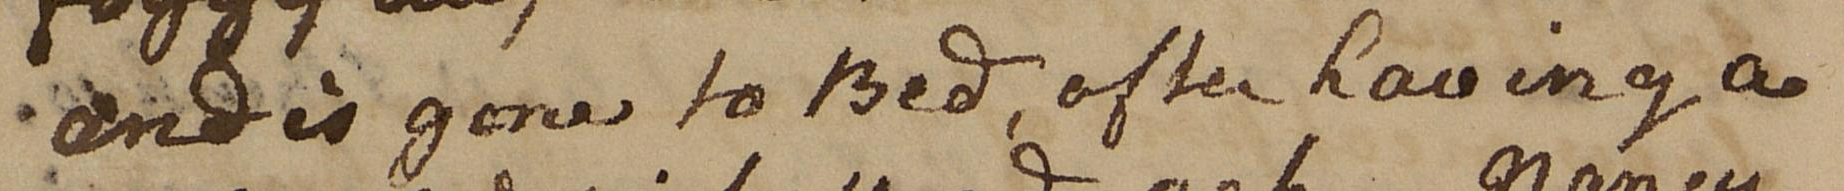and is gone to Bed, after having a
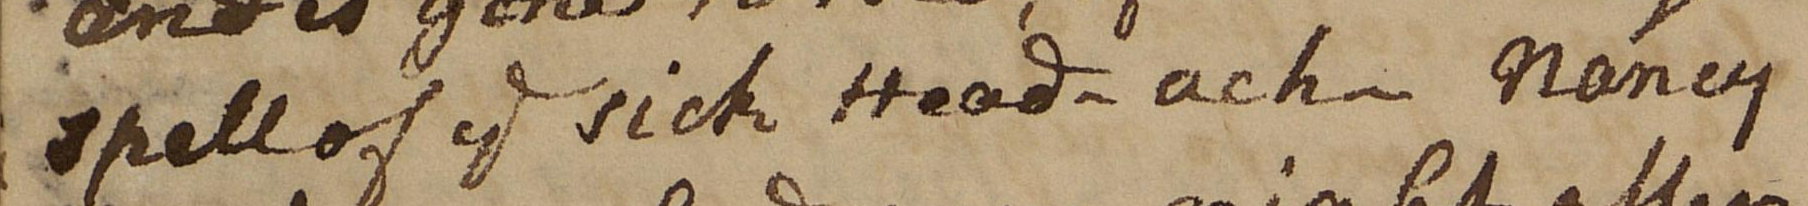spell of y^e sick Head-ach- Nancy
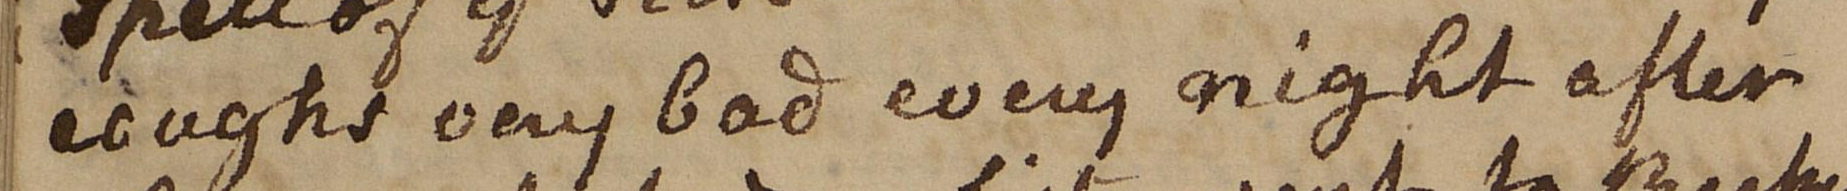coughs very bad every night after
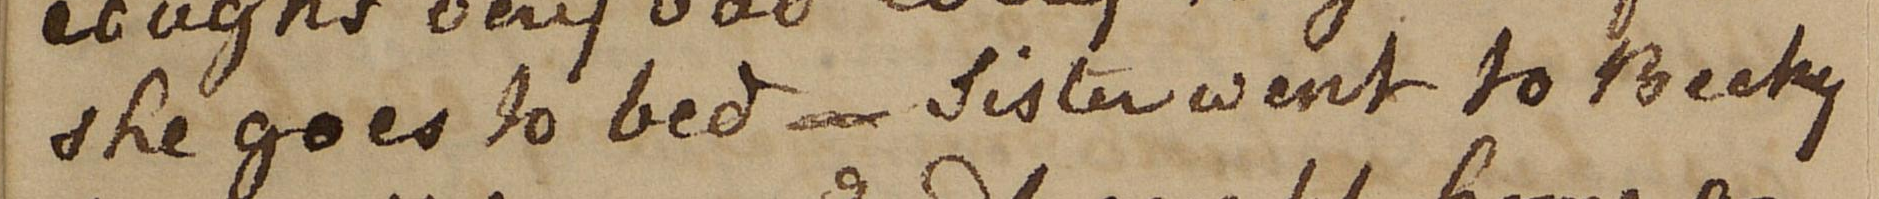she goes to bed- Sister went to Becky
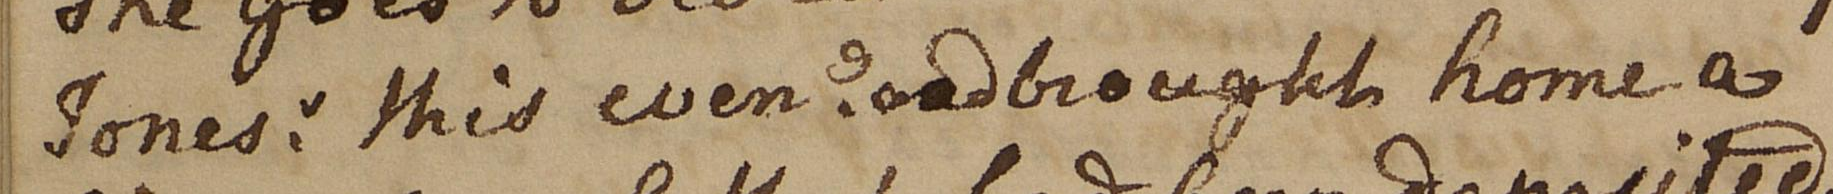Jones^s. this even^g. and brought home a
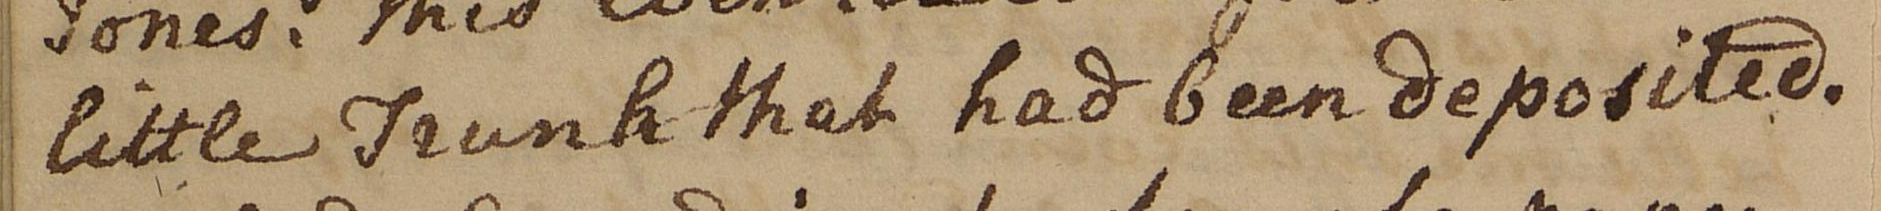little Trunk that had been deposited.
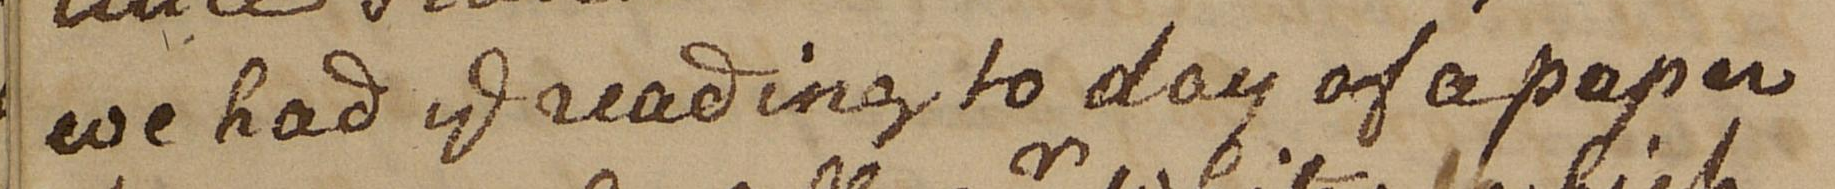we had y^e reading to day of a paper
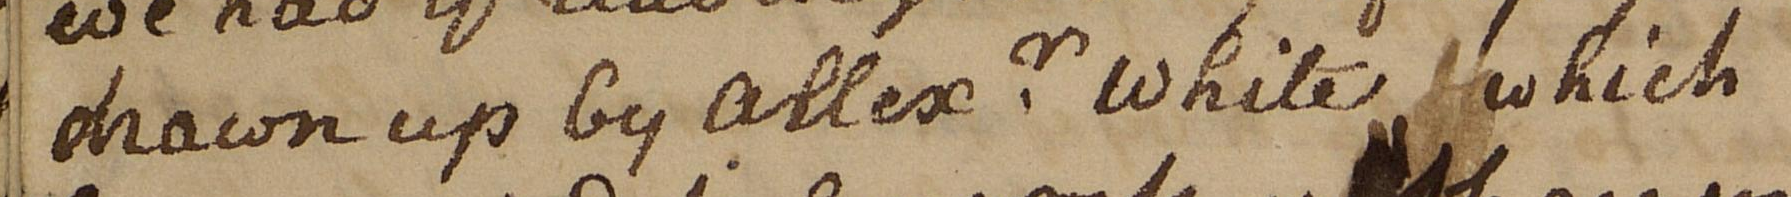drawn up by Allex^r. White which
